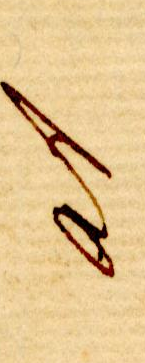at
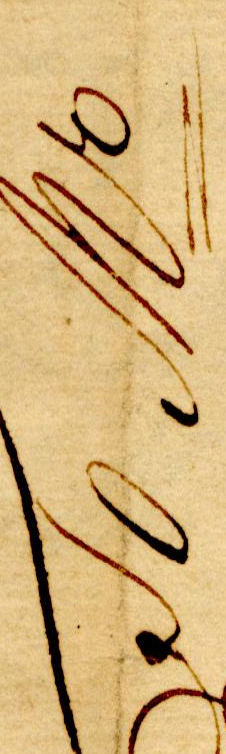To M^r
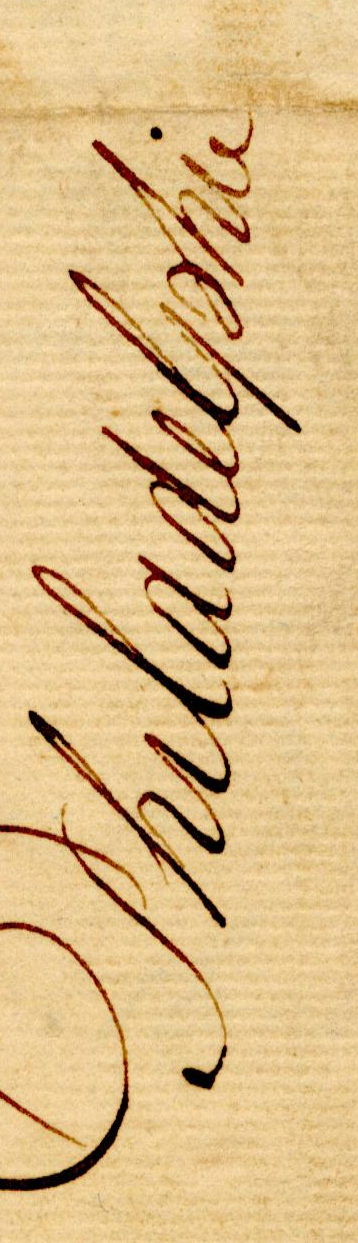Philadelphia
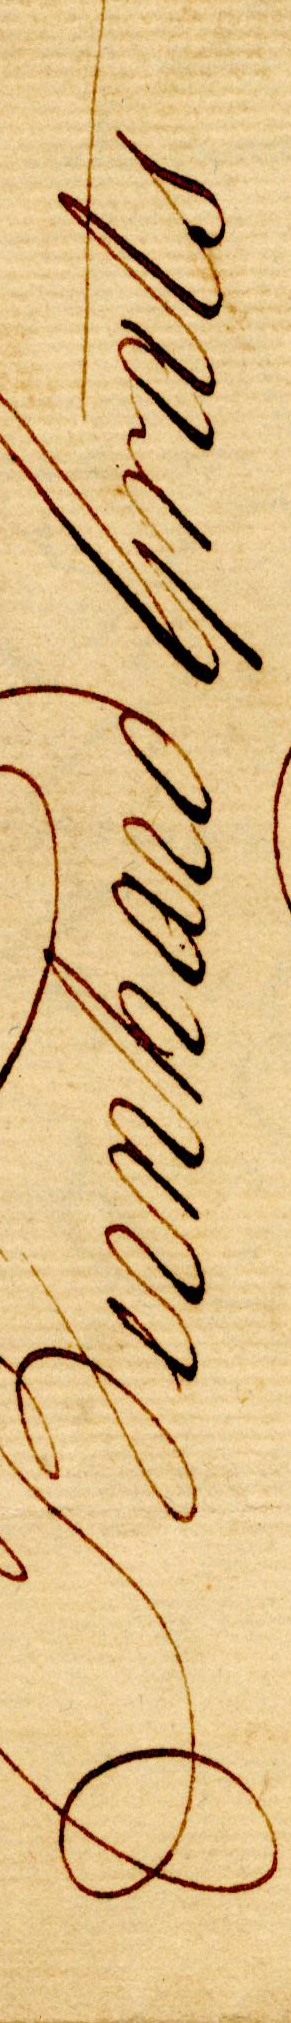Bernhard Grats
